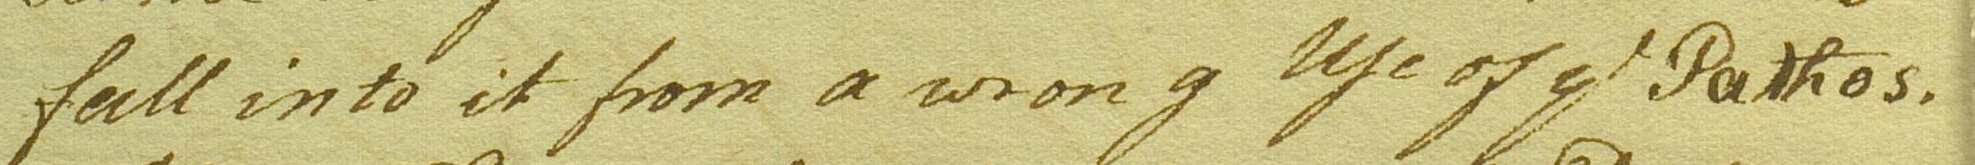fall into it from a wrong Use of y^e Pathos.
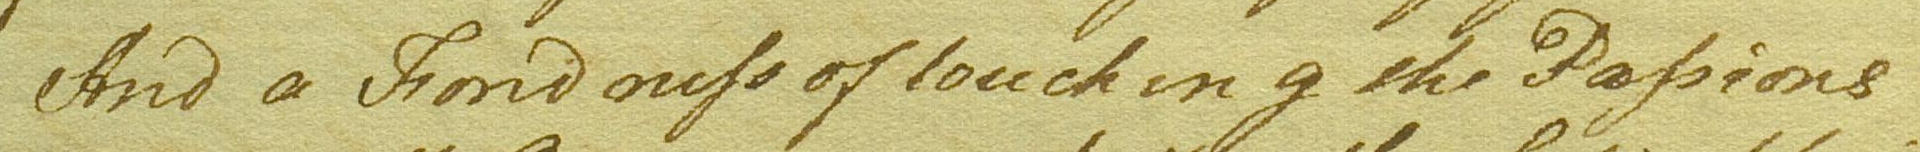And a Fondness of touching the Passions
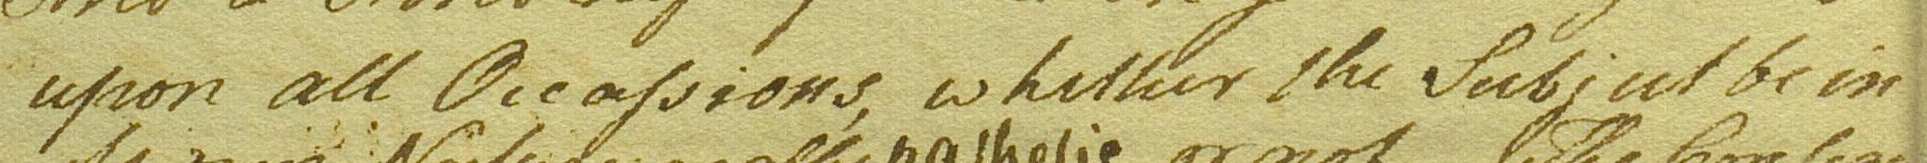upon all Occasions, whether the Subject be in
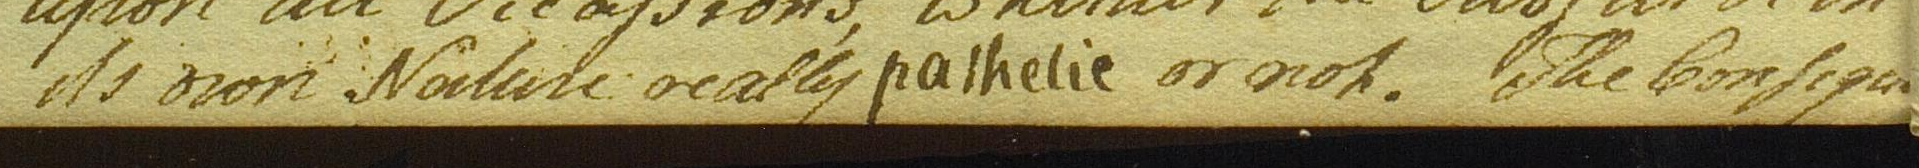its own Nature really pathetic or not. The Conseque
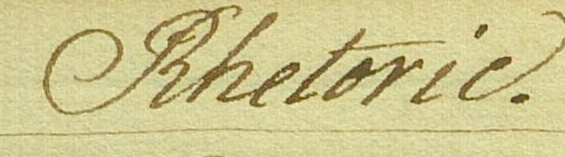Rhetoric.
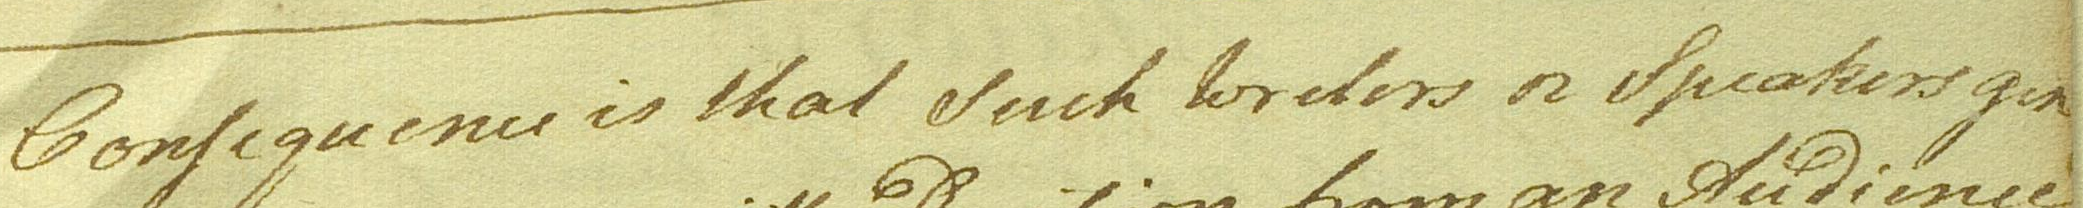Consequence is that such Oraters or Speakers gen
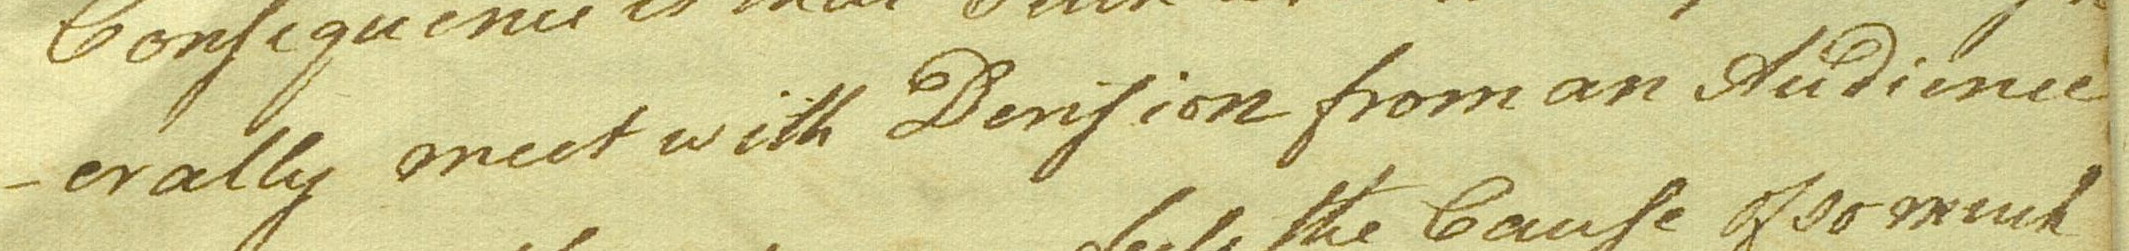-erally meet with Derision from an Audience
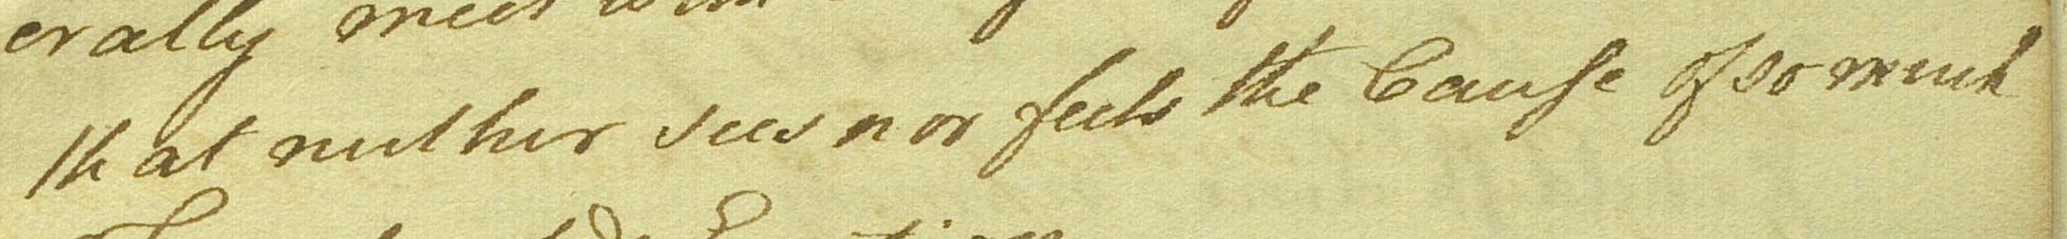that neither sees nor feels the Cause of so much
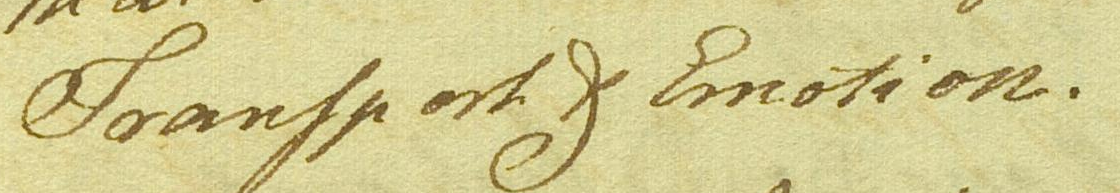Transport & Emotion.
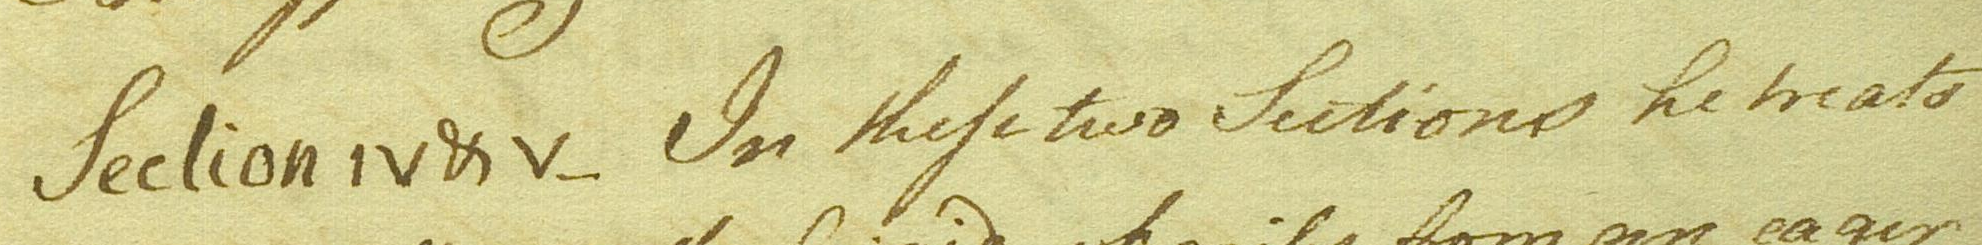Section IV & V- In these two Sections, he treats
